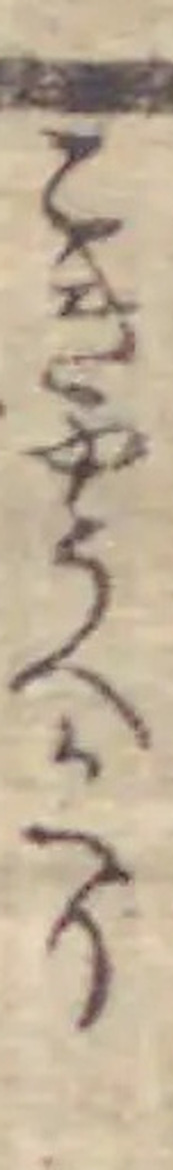こきやうへかへり
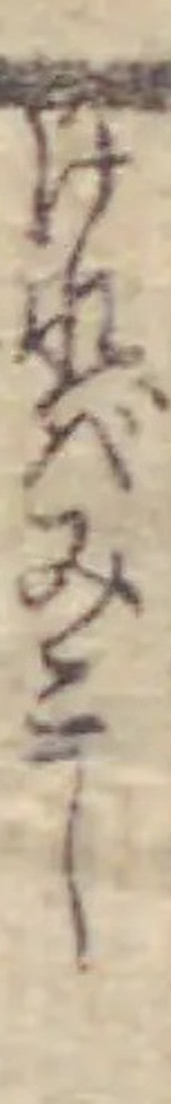ければみこし
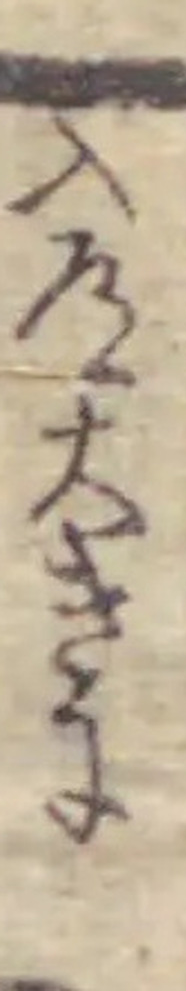入道大きに
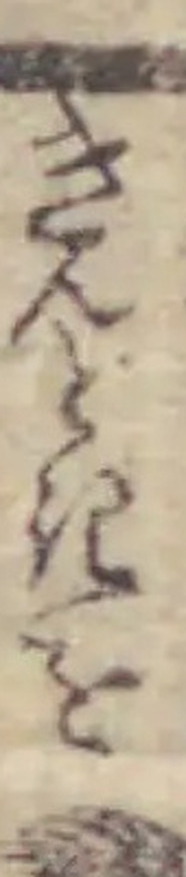きんときを
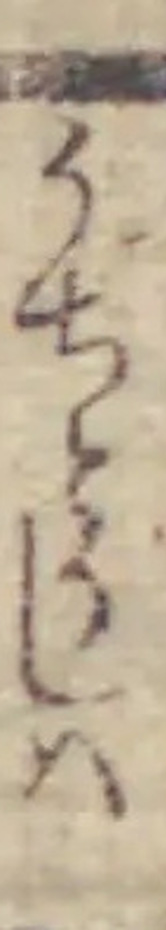うちとりしは
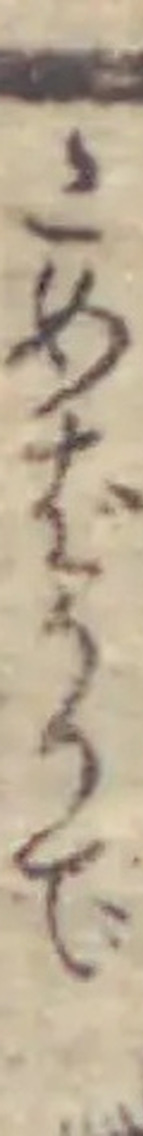ためばかりで
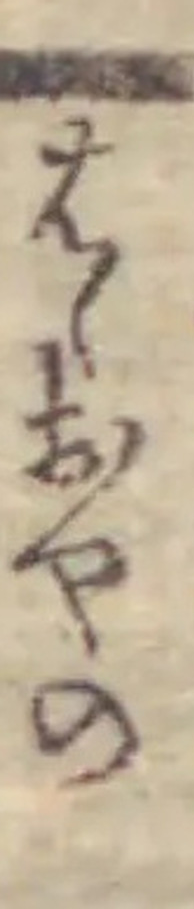はゝおやの
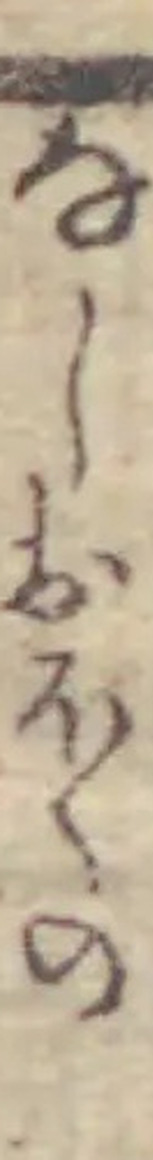なしおほくの
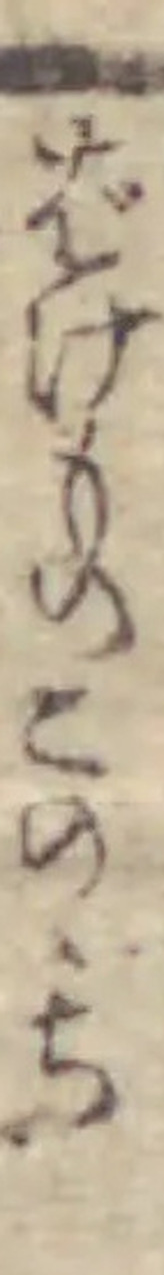ばけものこのゝち
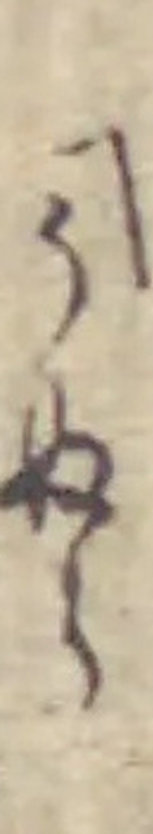〽うぬら
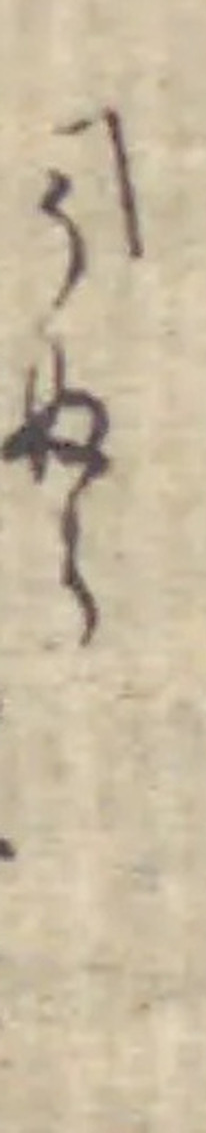〽うぬら
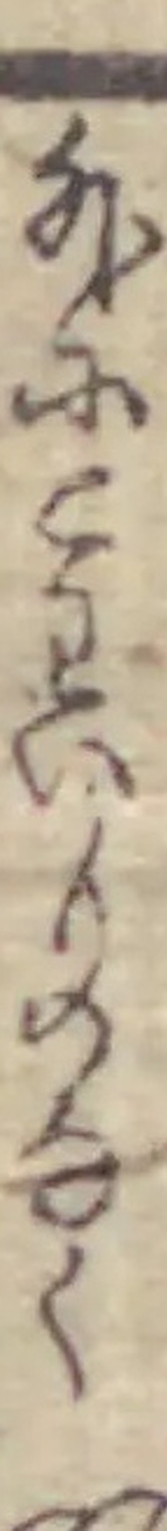外にこわいものなく
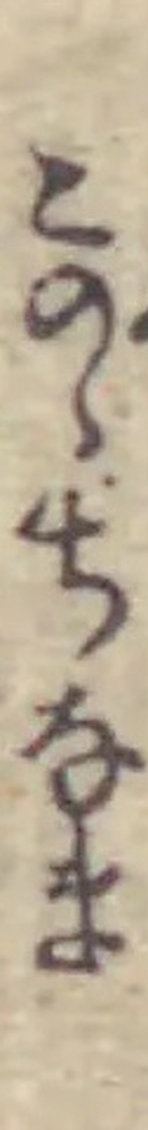このゝちなま
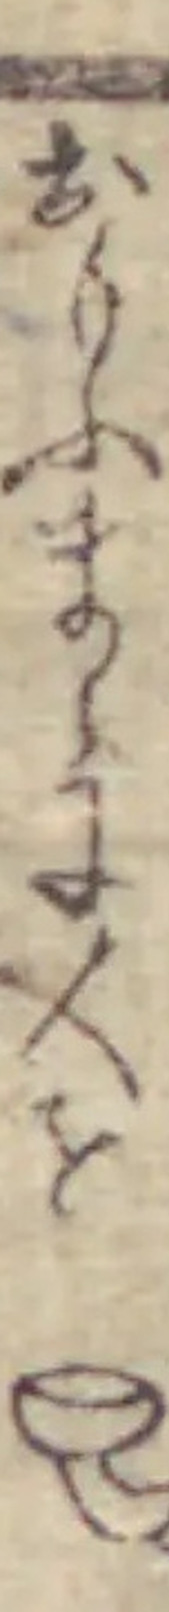おもふまゝに人を
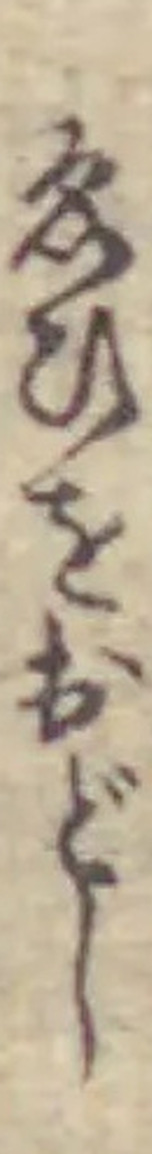ゑひをおどし
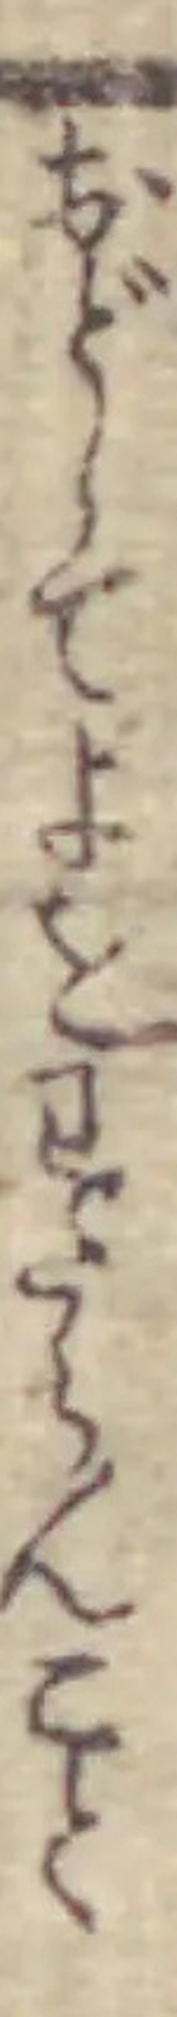おどしてよをわたらんこと
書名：化物敵討 2巻
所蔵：国立国会図書館 National Diet Library, JAPAN
